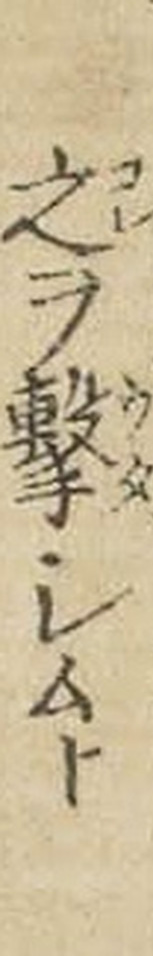之ヲ撃シムト
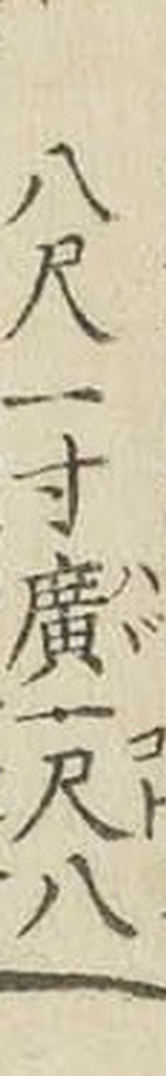八尺一寸広一尺八
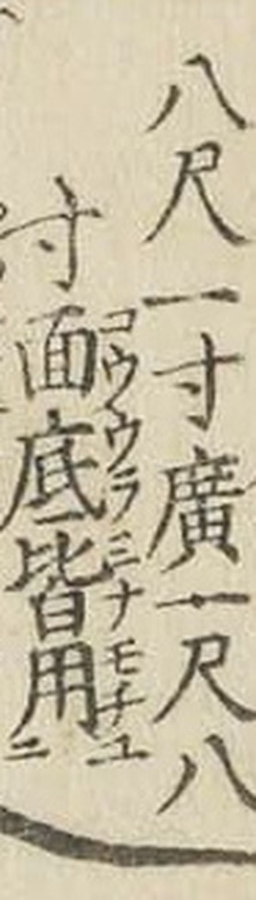寸面底皆用

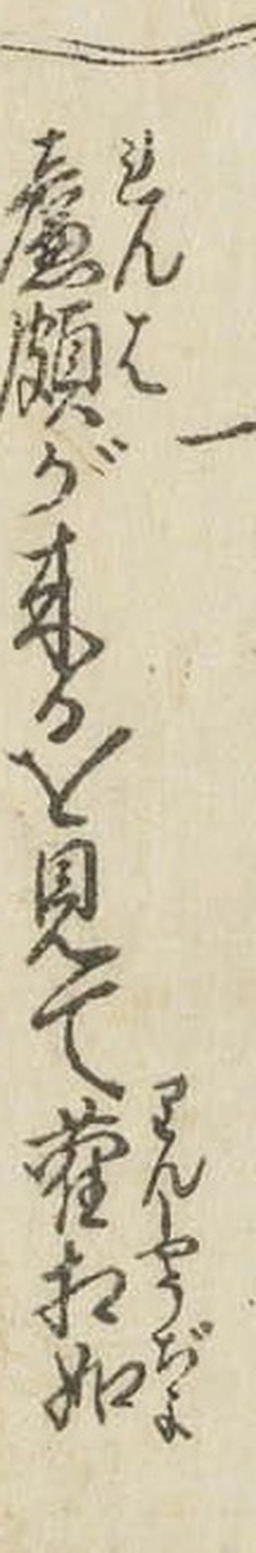廉頗が来るを見て藺相如
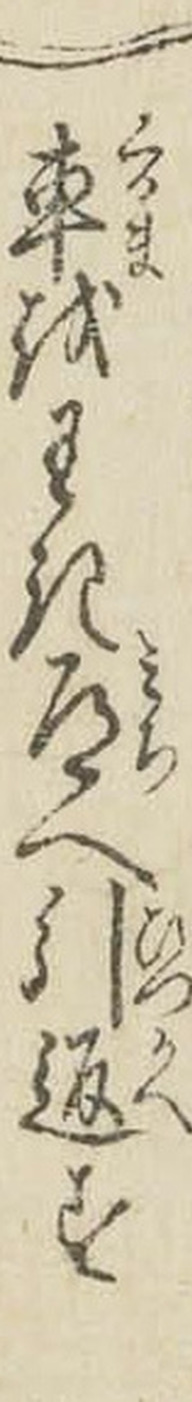車をわき道へ引返す

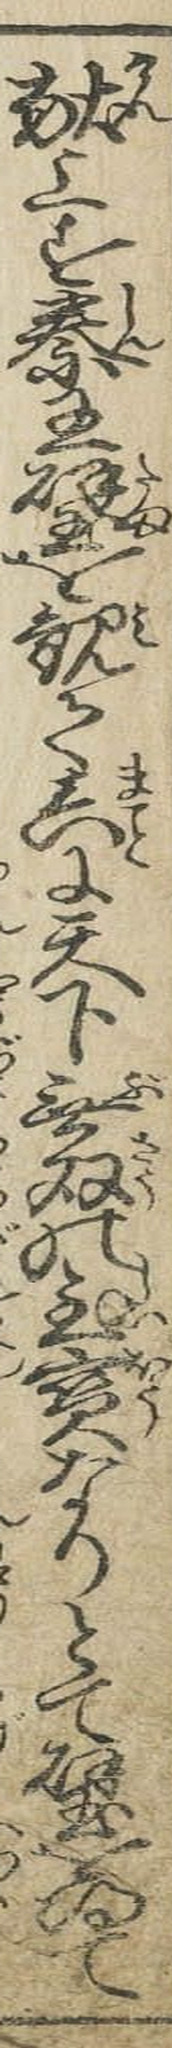献上す秦王璧を観て真に天下無双の至宝なりとて璧を得て
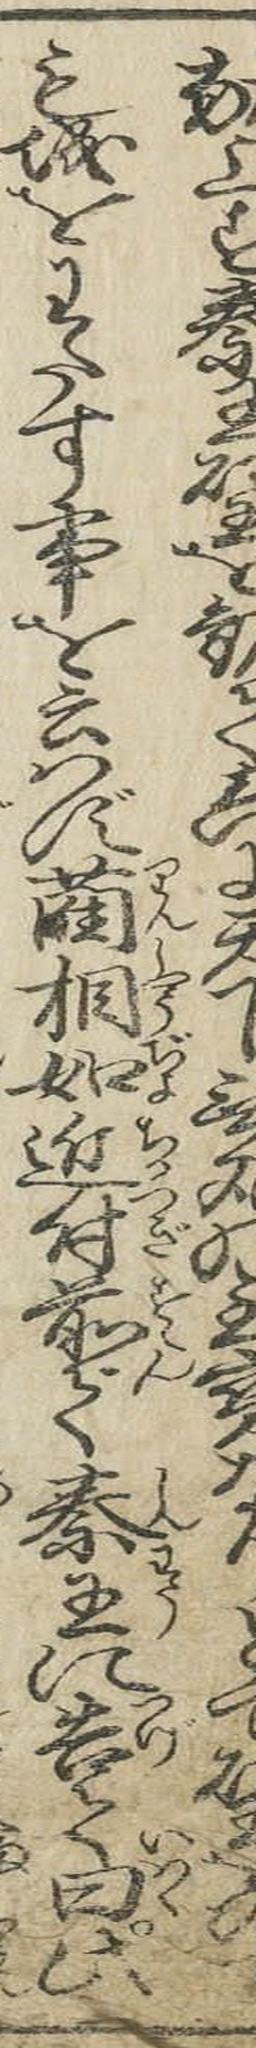も城をわたす事を云はず藺相如近付前で秦王に告て曰。此
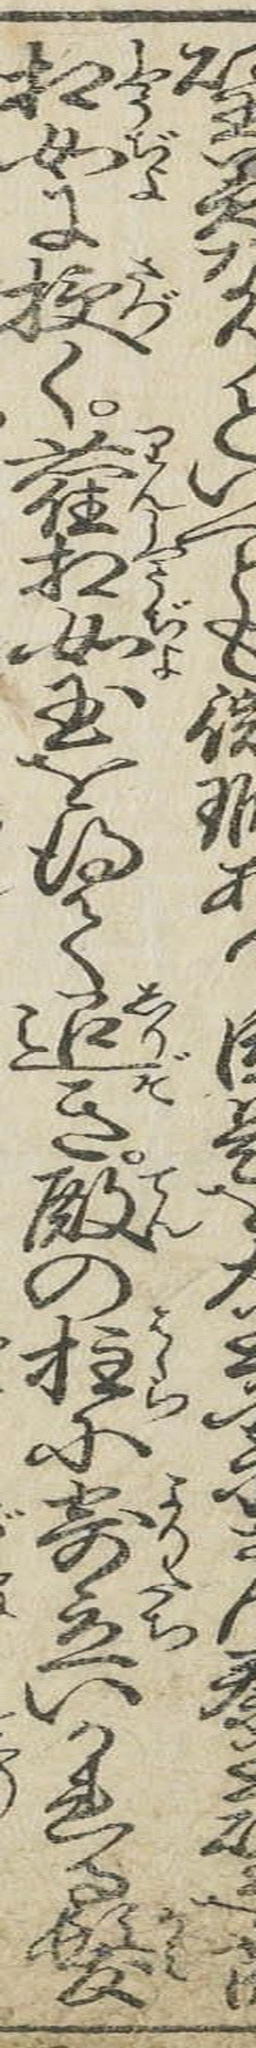相如に授く。藺相如玉を得て退き。殿の柱に寄立いかれる髪
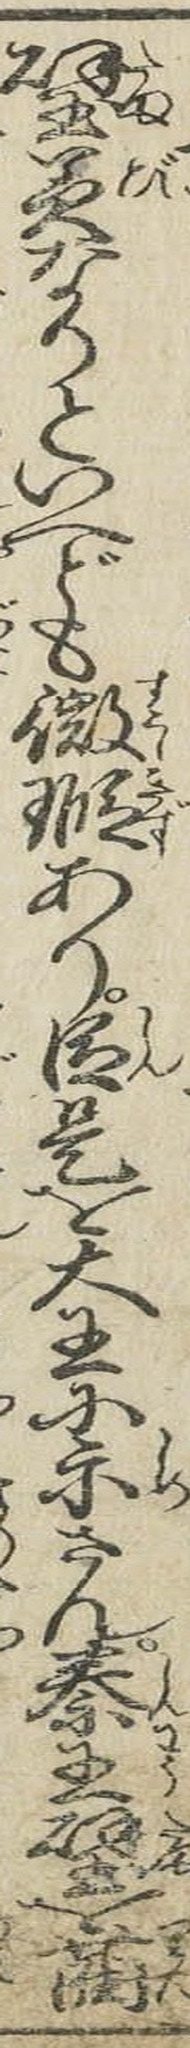璧美なりといへども微瑕あり。臣是を大王に示さん。秦王璧を藺
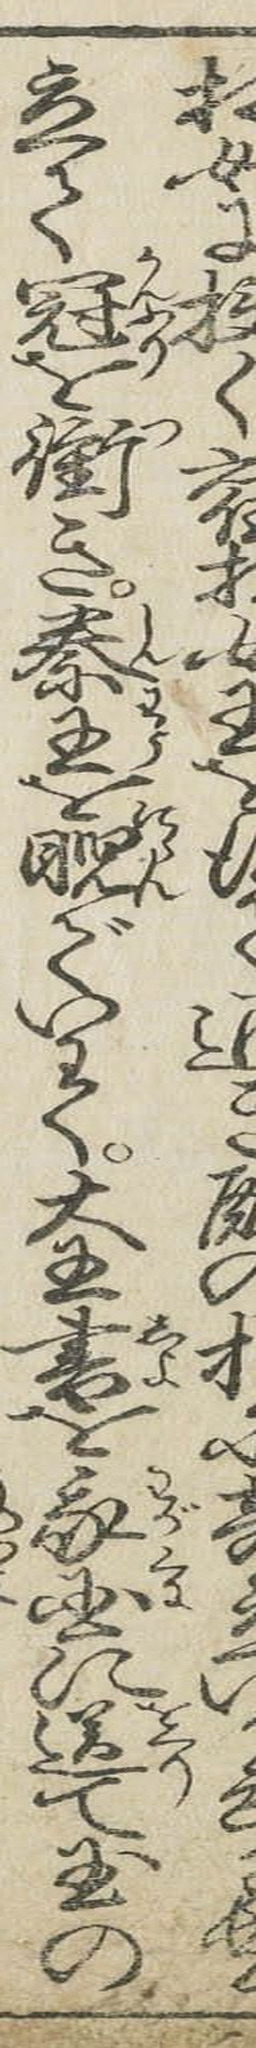立て冠を衝き。秦王を倪でいわく。大王書を我国に送て玉の
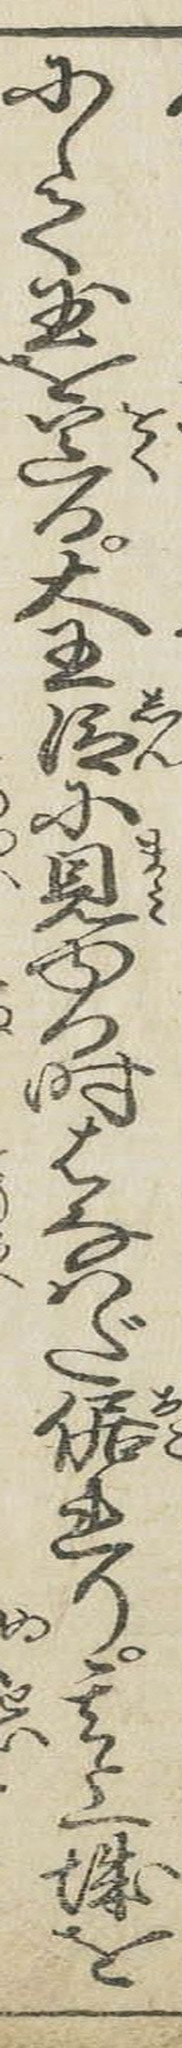にして玉を送る。大王臣に見ゆる時はなはだ倨れり。其上城を
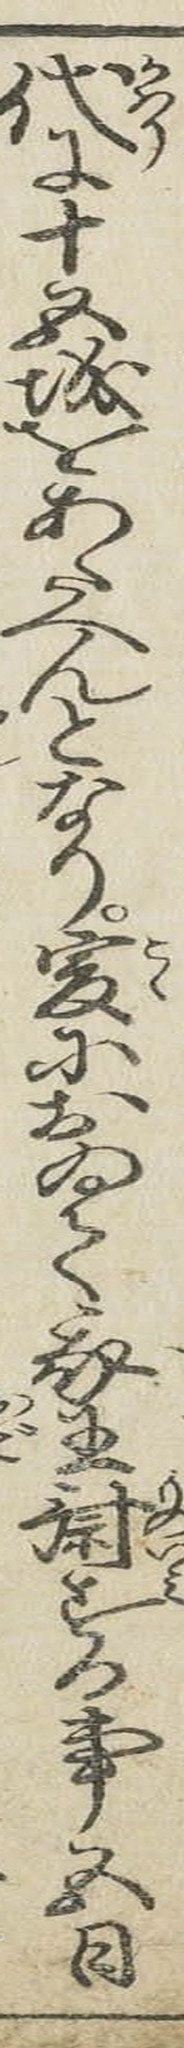代に十五城をあたへんとなり。爰におゐて我王斎する事五日
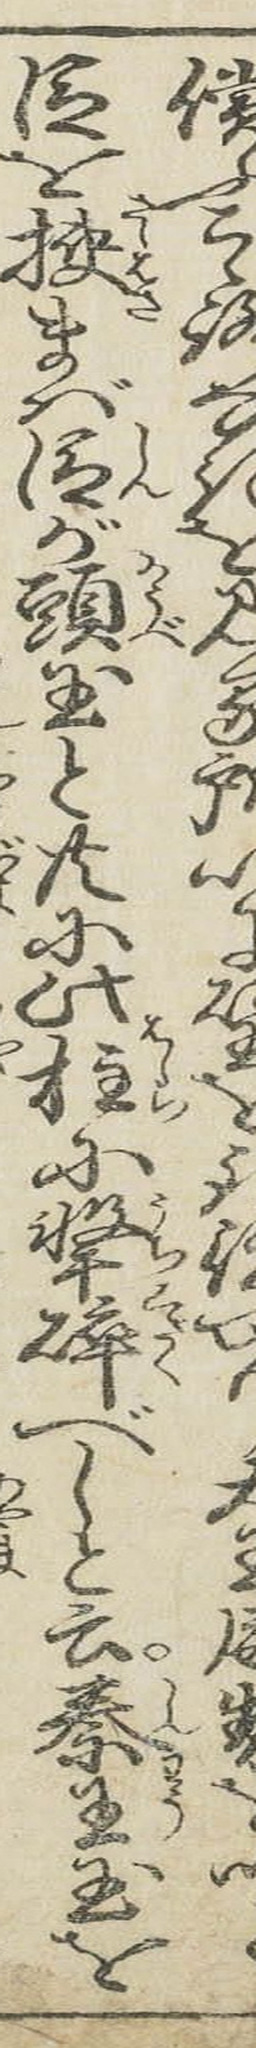臣を挟まば臣が頭玉と共に此柱に撃砕べしと云。秦王玉を
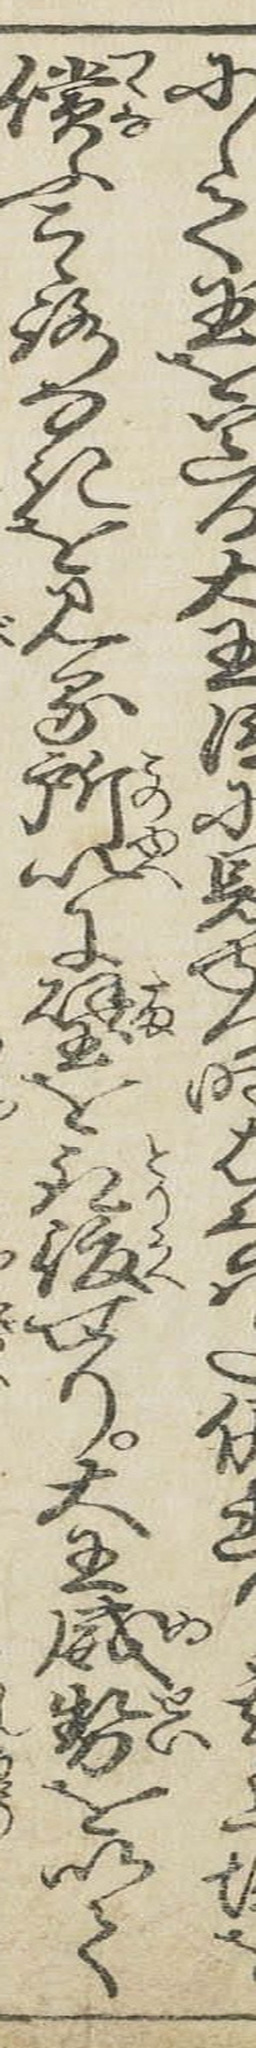償ふこゝろなきを見る所以に璧を取復せり。大王威勢を以て
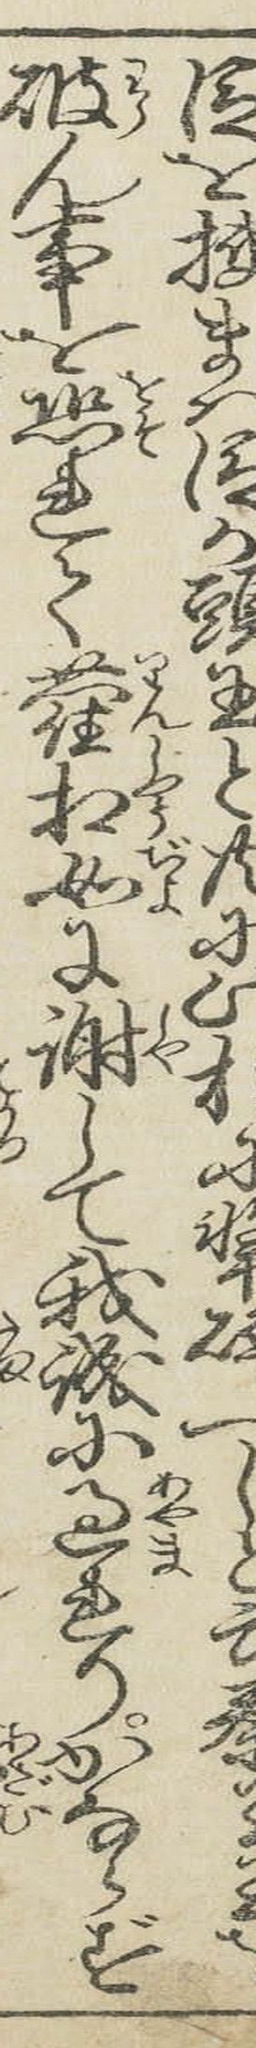破ん事を恐れて藺相如に謝して我誠に過れり。かならず
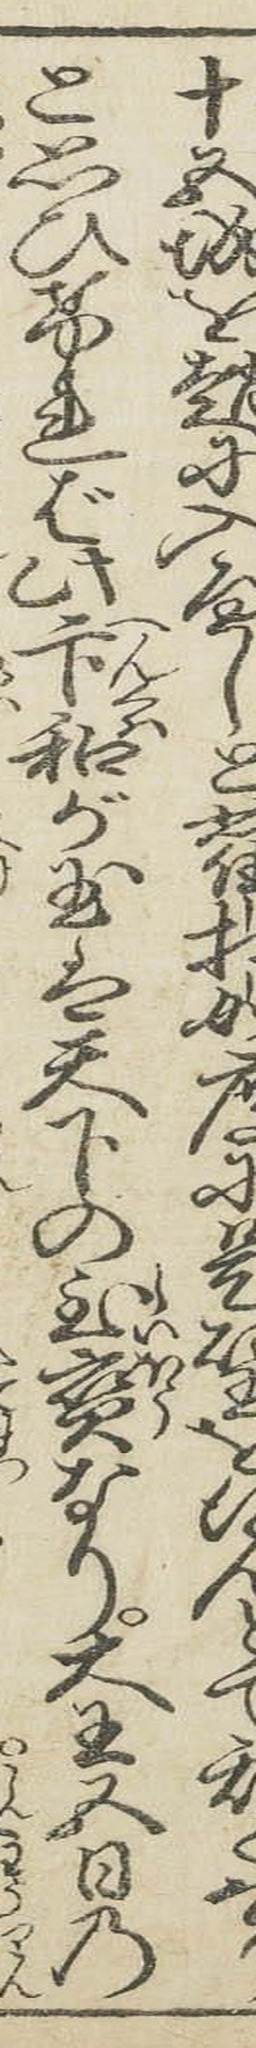と思ひければ此卞和が玉は天下の至宝なり。大王五日の
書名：絵本写宝袋 9巻 6之巻
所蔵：東京学芸大学教育コンテンツアーカイブ
